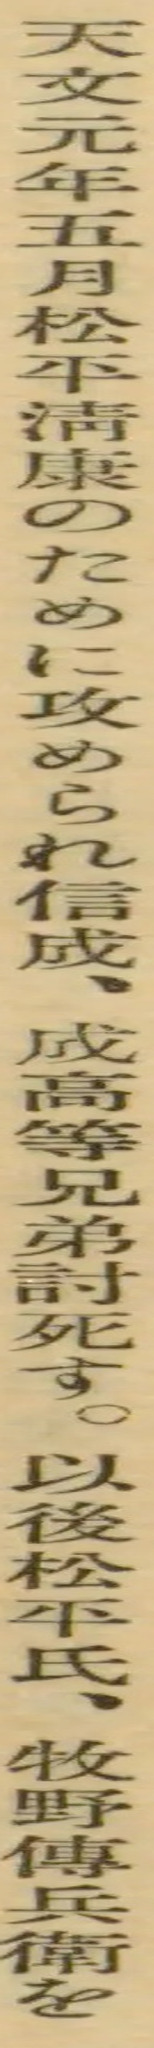天文元年五月松平清康のために攻められ信成、成高等兄弟討死す。以後松平氏、牧野伝兵衛を

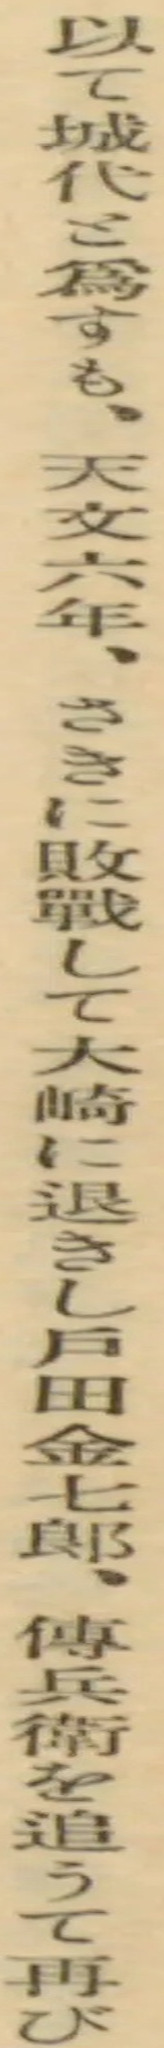以て城代と為すも、天文六年、さきに敗戦して大崎に退きし戸田金七郎、伝兵衛を追うて再び
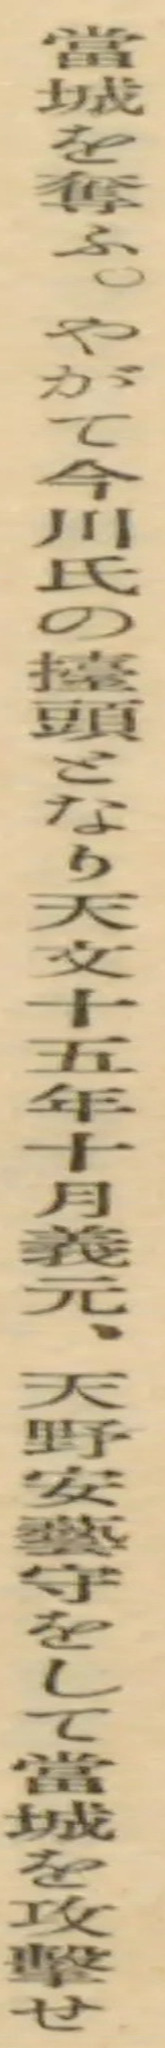当城を奪ふ。やがて今川氏の擡頭となり天文十五年十月義元、天野安芸守をして当城を攻撃せ
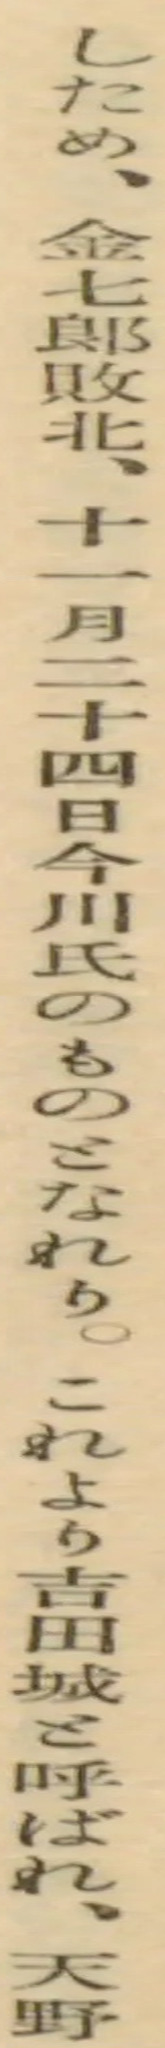しため、金七郎敗北、十一月二十四日今川氏のものとなれり。これより吉田城と呼ばれ、天野
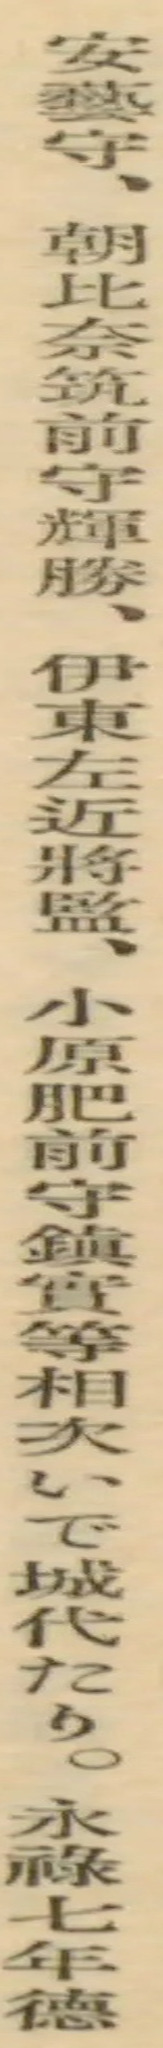安芸守、朝比奈筑前守輝勝、伊東左近将監、小原肥前守鎮実等相次いで城代たり。永禄七年徳
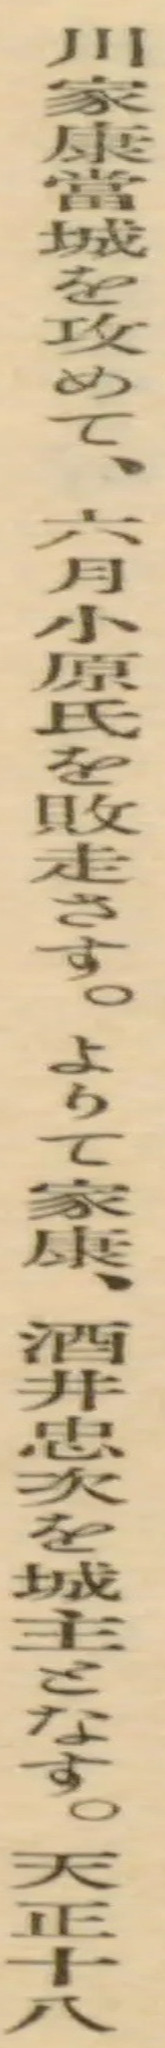川家康当城を攻めて、六月小原氏を敗走さす。よりて家康、酒井忠次を城主となす。天正十八
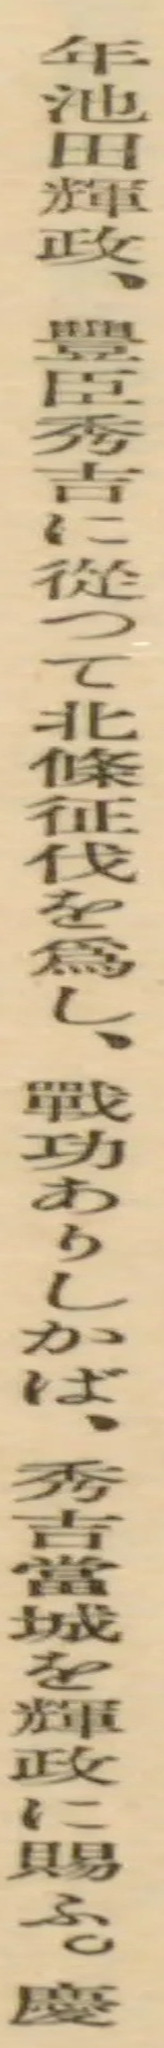年池田輝政、豊臣秀吉に従つて北條征伐を為し、戦功ありしかば、秀吉当城を輝政に賜ふ。慶
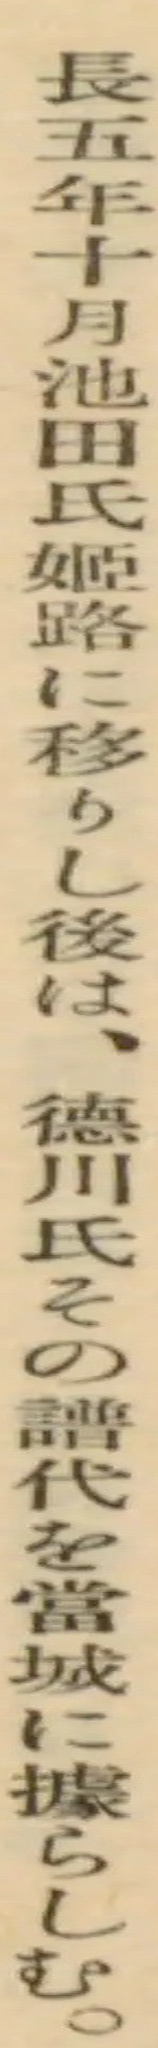長五年十月池田氏姫路に移りし後は、徳川氏その譜代を当城に拠らしむ。
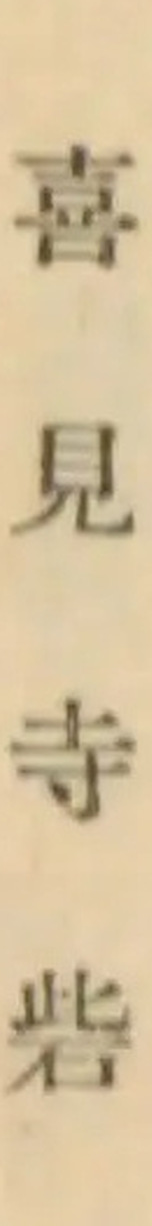喜見寺砦
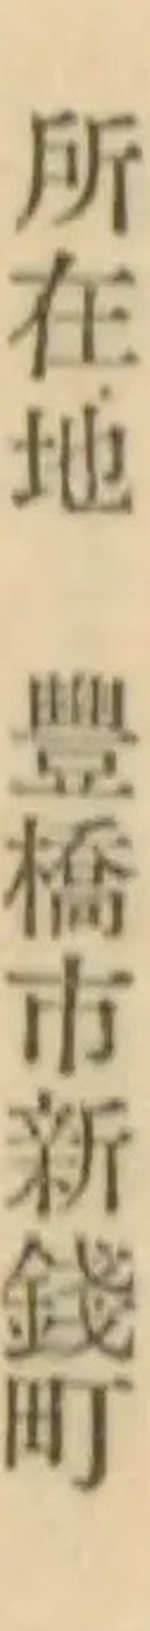所在地豊橋市新銭町
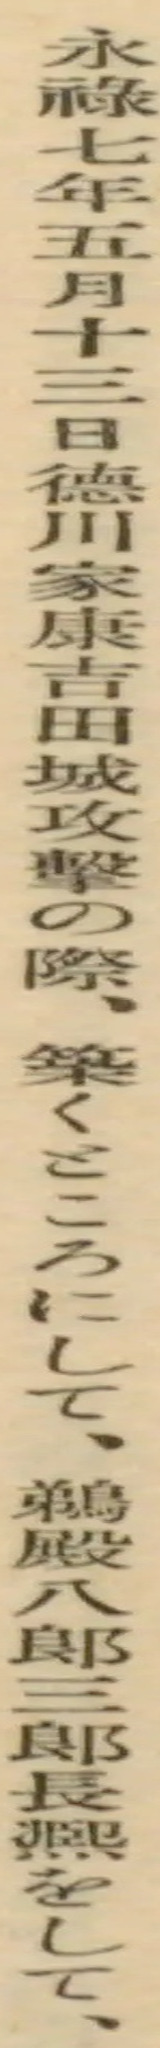永禄七年五月十三日徳川家康吉田城攻撃の際、築くところにして、鵜殿八郎三郎長凞をして、
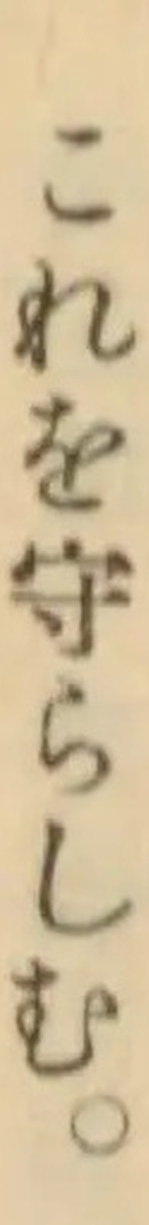これを守らしむ。
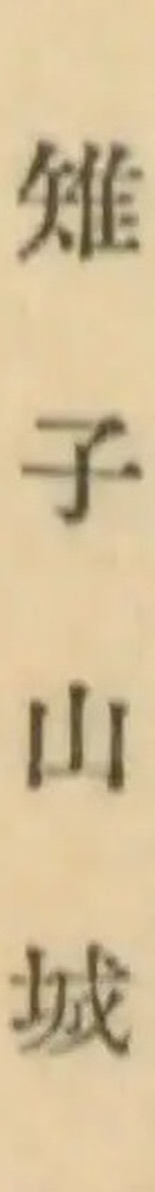雉子山城
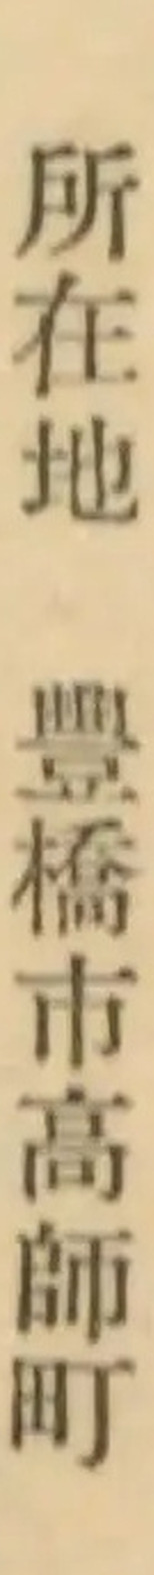所在地豊橋市高師町
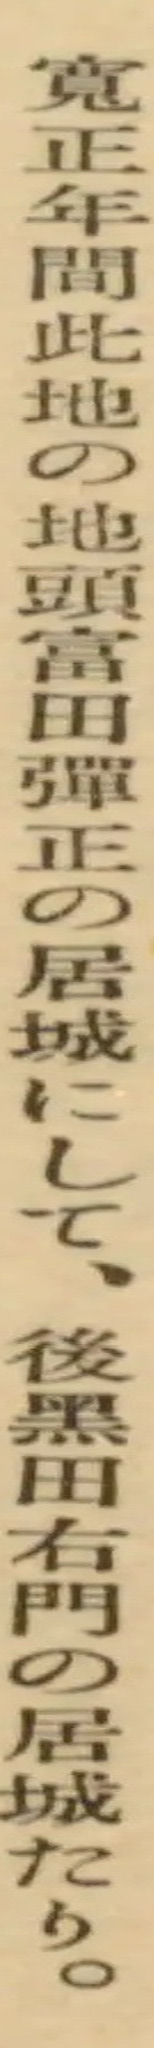寛正年間此地の地頭富田弾正の居城にして、後黒田右門の居城たり。
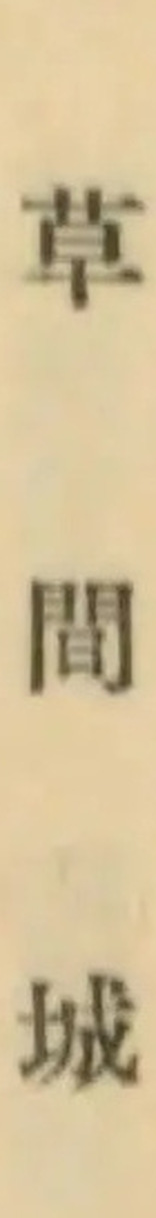草間城
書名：東三河之古城
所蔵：国立国会図書館 National Diet Library, JAPAN
